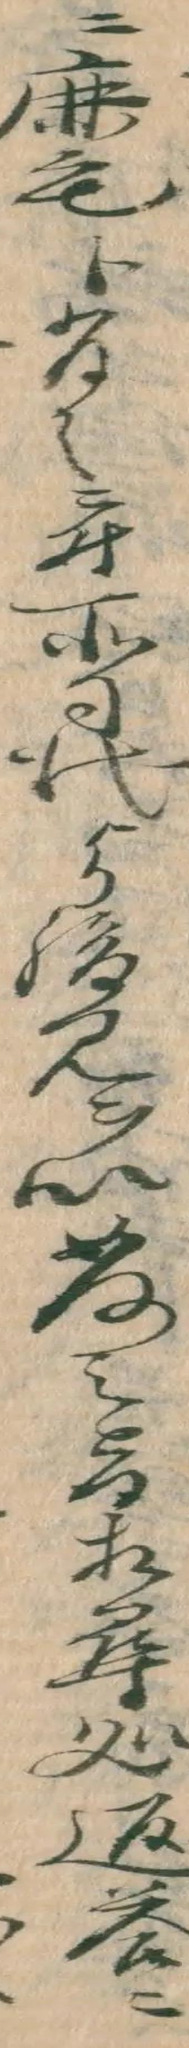ニ鹿毛ト有之ニ付所司代より後見ヲ以如何之旨相尋候処返答ニ
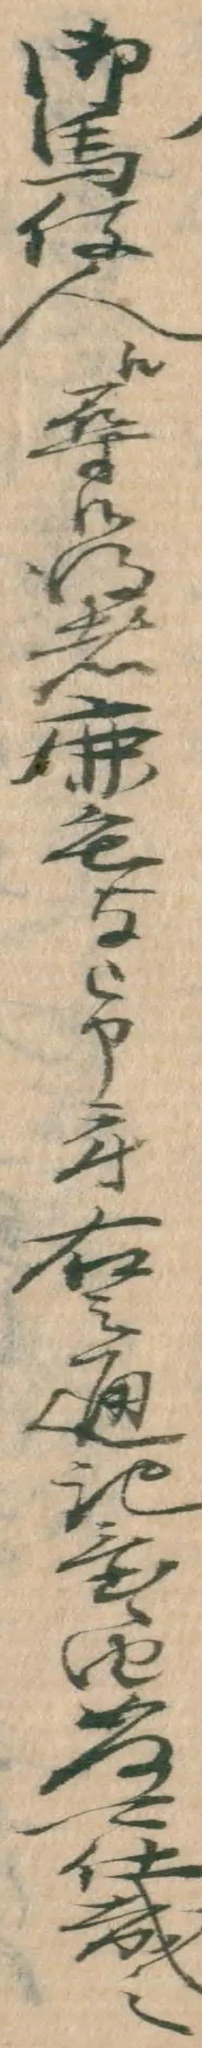御馬役人え尋候得者鹿毛与被申ニ付右之通記置候由如何可仕哉之
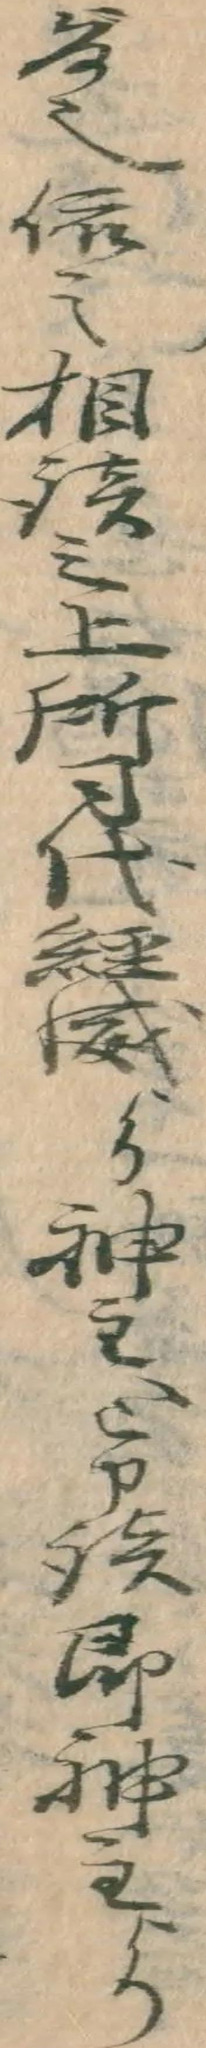旨也依之相談之上所司代経威より神主へ被申談即神主より
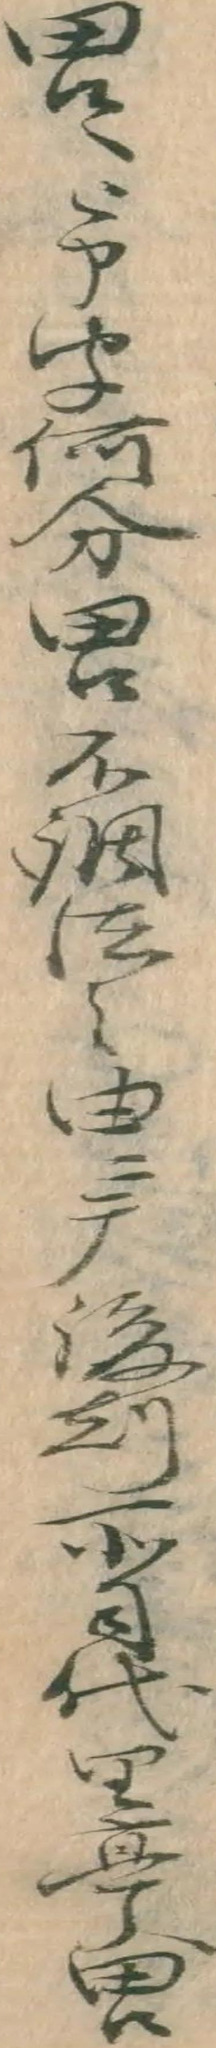田口へ被申聞何分田口不調法之由ニテ後刻一所司代里亭田口

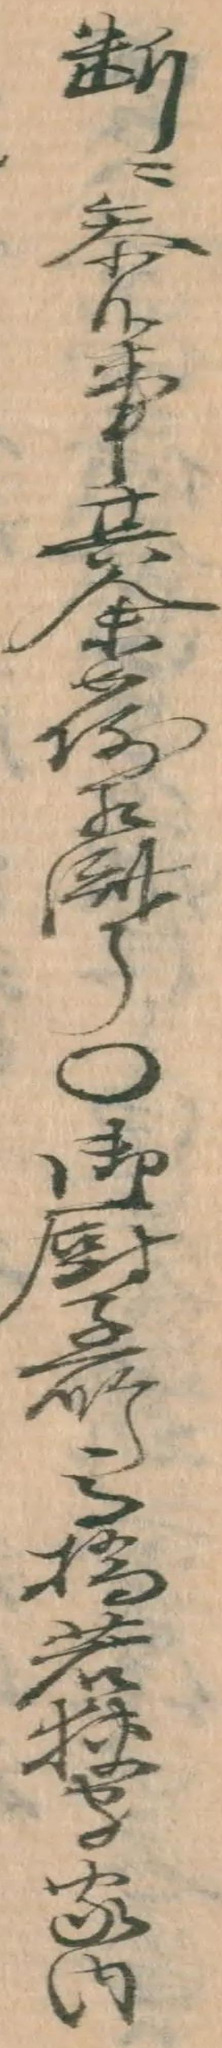断ニ参候事其余如例相済了◯御厨子所高橋若狭守家内
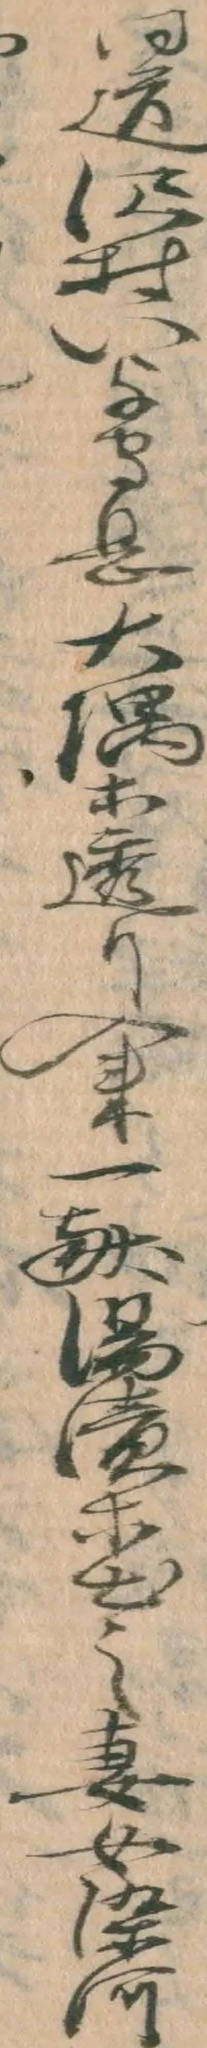同道沢村いよ守息大隅等透引入来一献湯漬等出之妻女染河
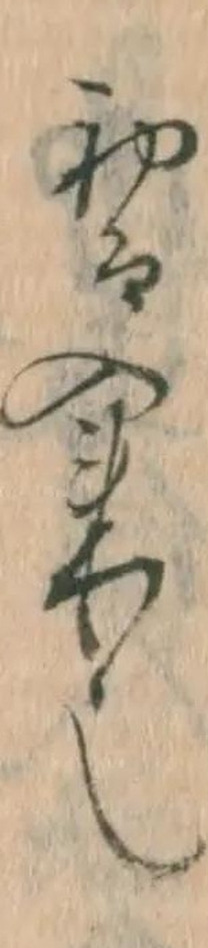初而入来也
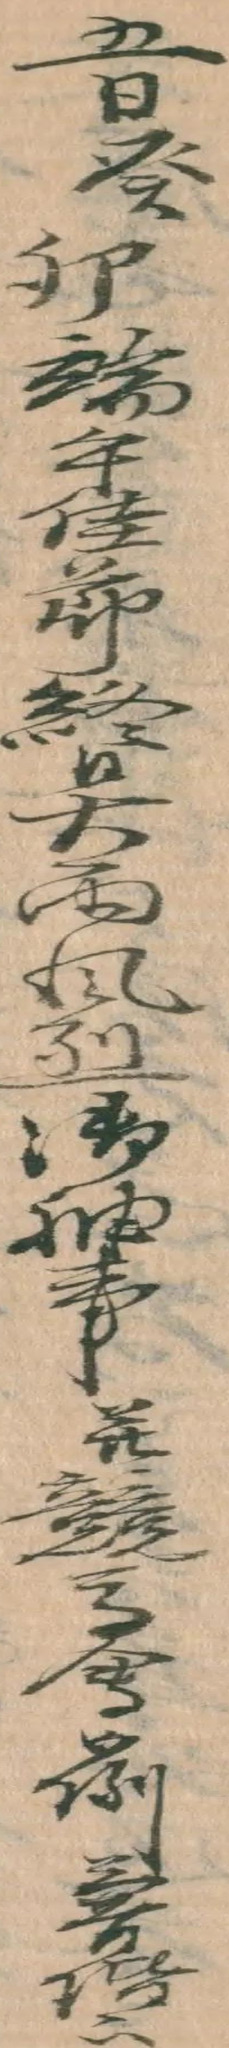五日癸卯端午佳節終日大雨風烈御神事并競馬会如例兼日階下
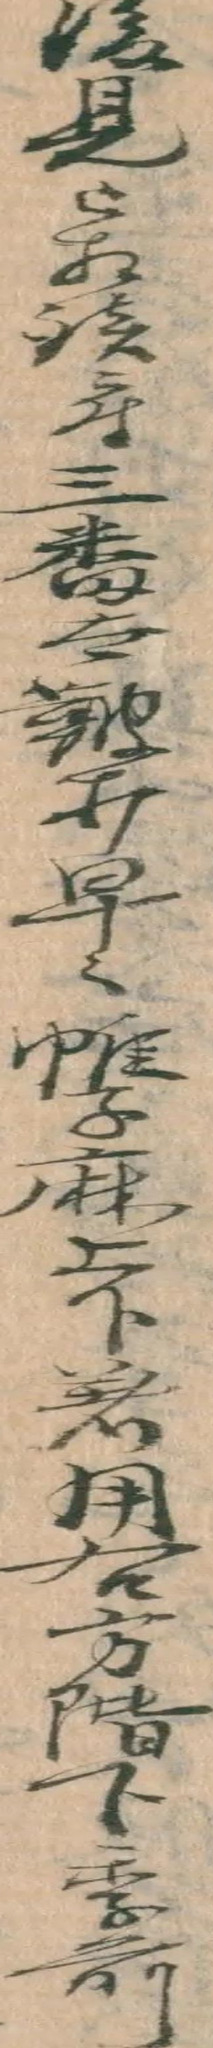後見被相談ニ付三番太皷打早々帷子麻上下着用右方階下季前
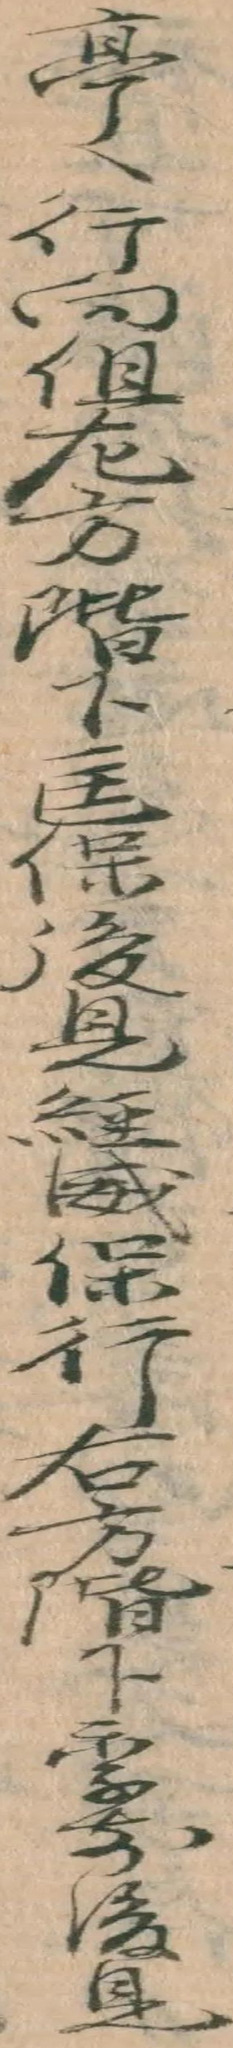亭へ行向但左方階下匡保後見経威保行右方階下季前後見
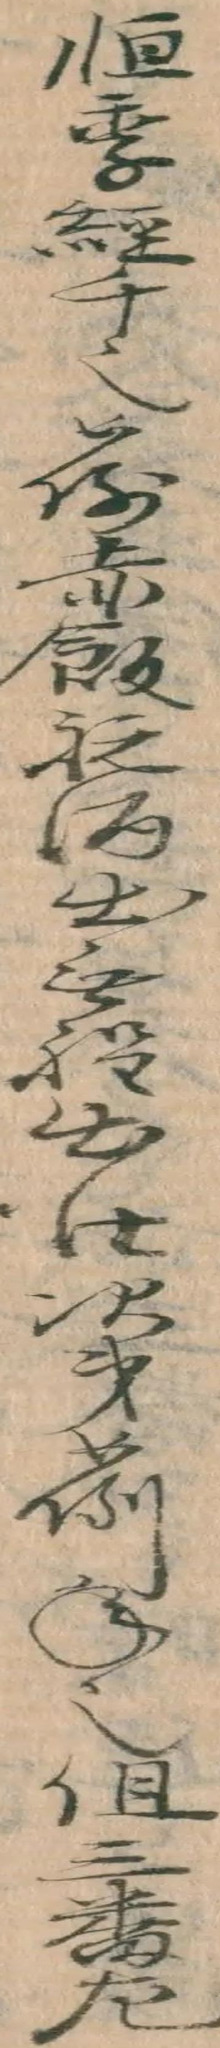恒季経千也如例赤飯祝酒出無程出仕次第如例年也但三番左
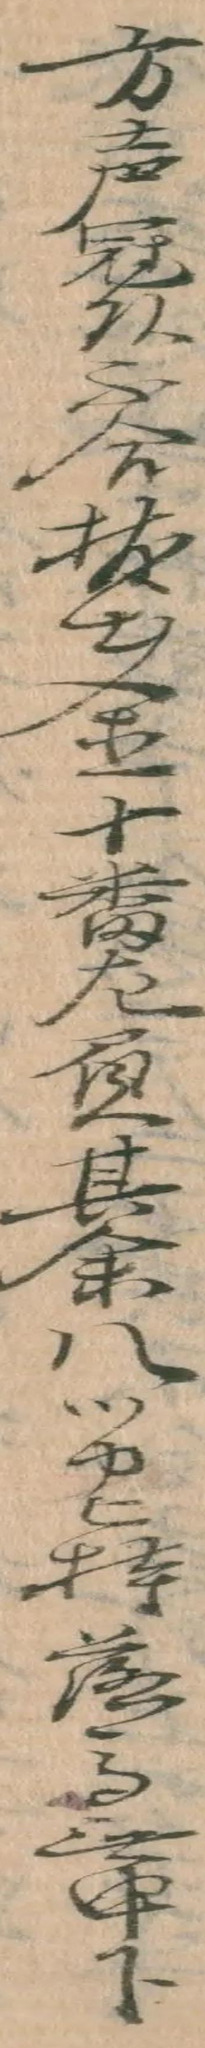方声冠頭不合抜出入直十番左負其余八ツカヒ持落馬無申下
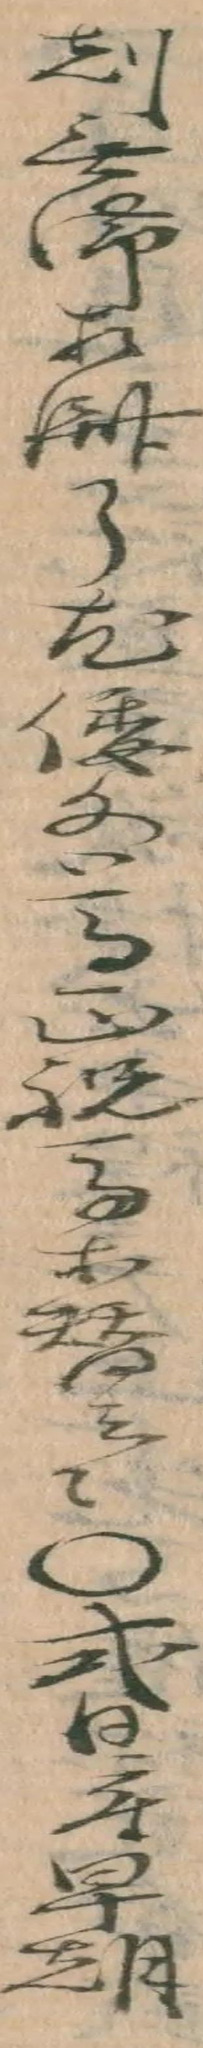刻無滞相済了尤倭文御馬正祝馬相替云々○式日ニ付早朝
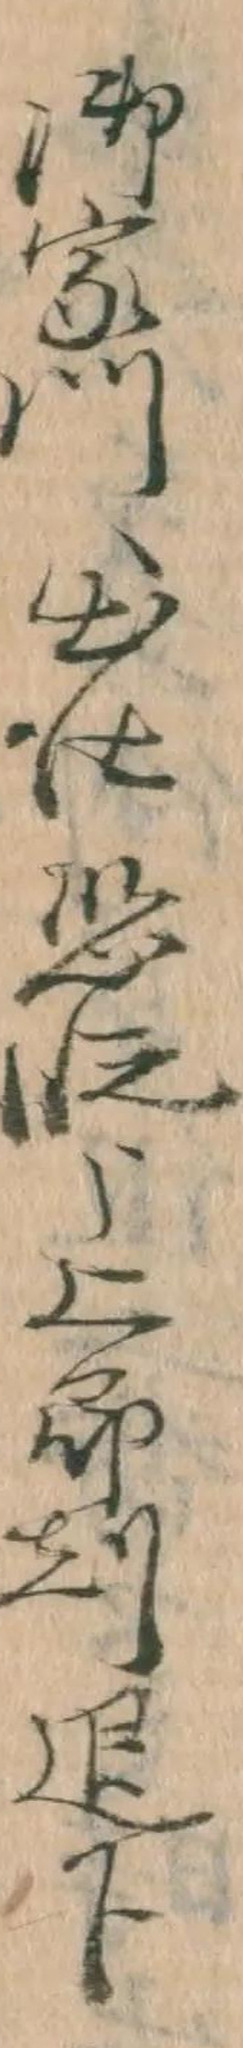御家門へ出仕恐悦申上候即刻退下
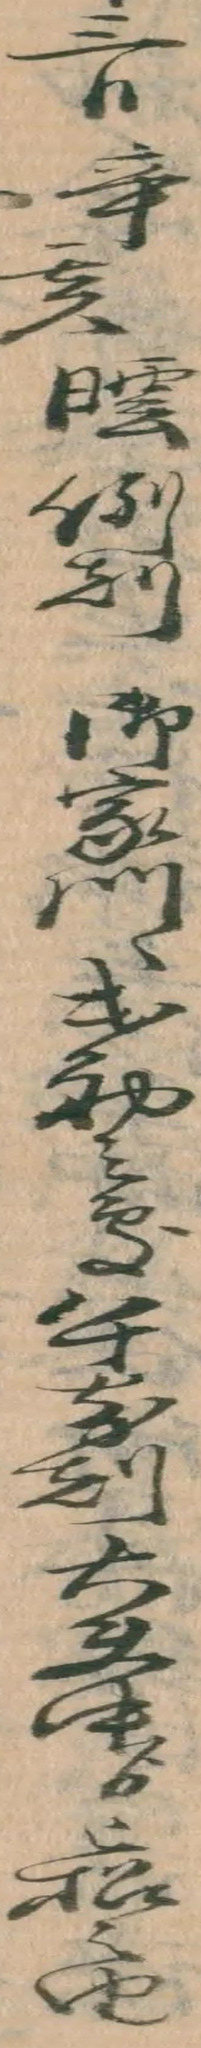十三日辛亥曇例刻御家門へ出勤之處午前刻大夫中ゟ被招之由
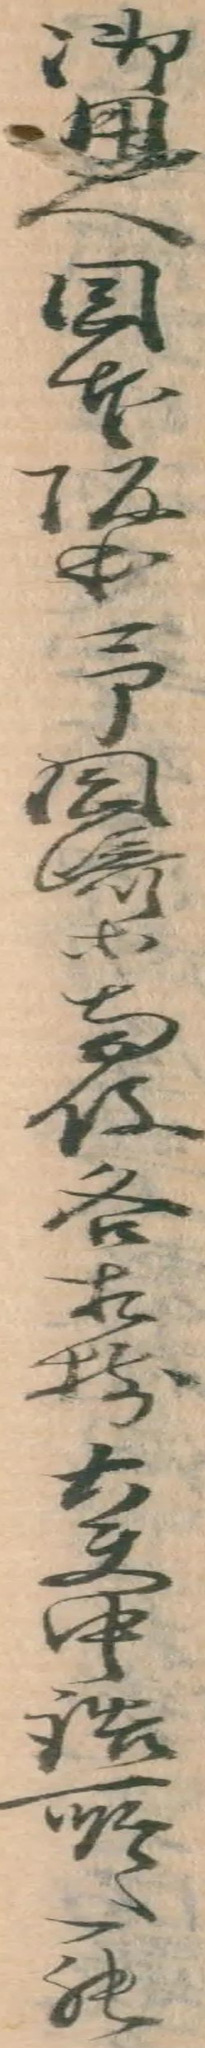御用人岡本坂本予岡崎等両役各相揃大夫中詰所へ罷
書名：賀茂社記録. 第65冊
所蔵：国立国会図書館 National Diet Library, JAPAN
